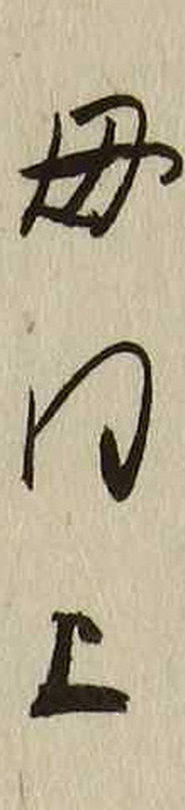母同上
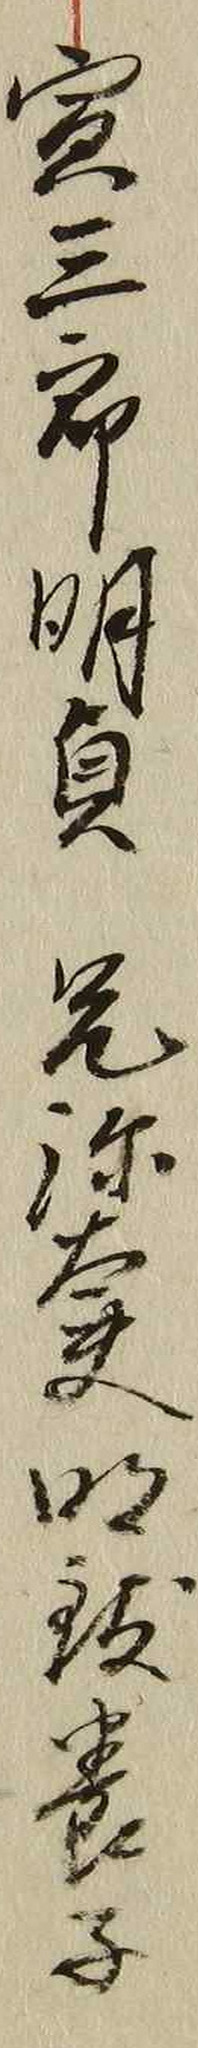寅三郎明貞兄弥太夫明致養子
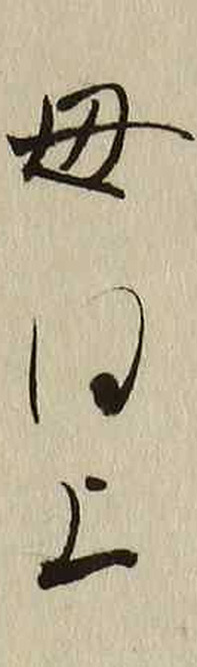母同上
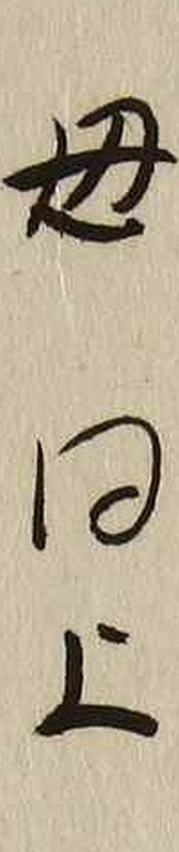母同上
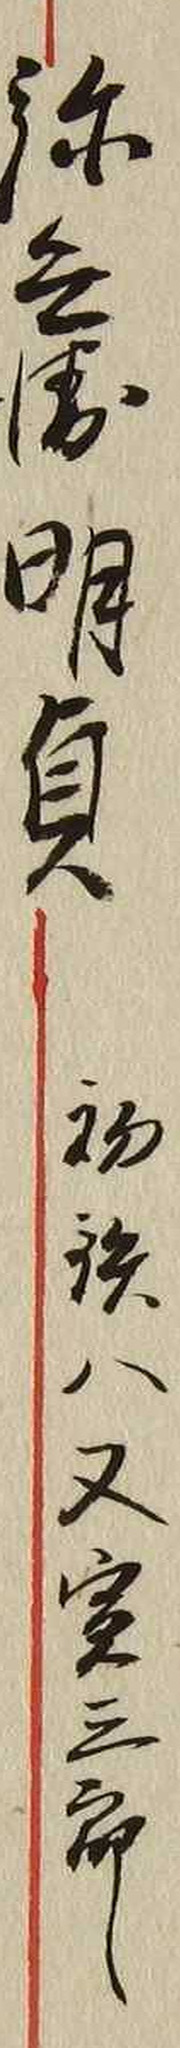弥兵衛明貞初鉄八又寅三郎
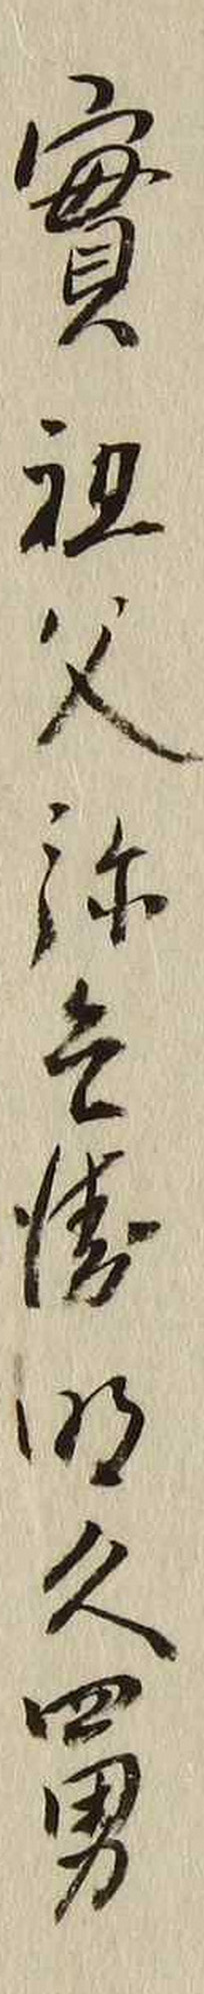実祖父弥兵衛明久四男
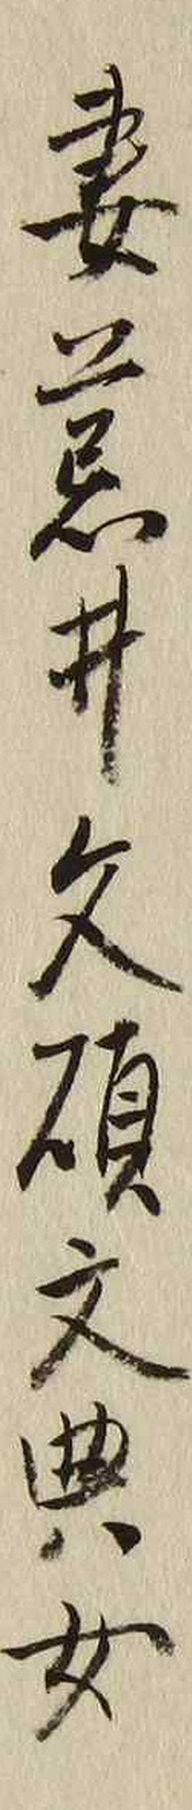妻荒井文碩文典女
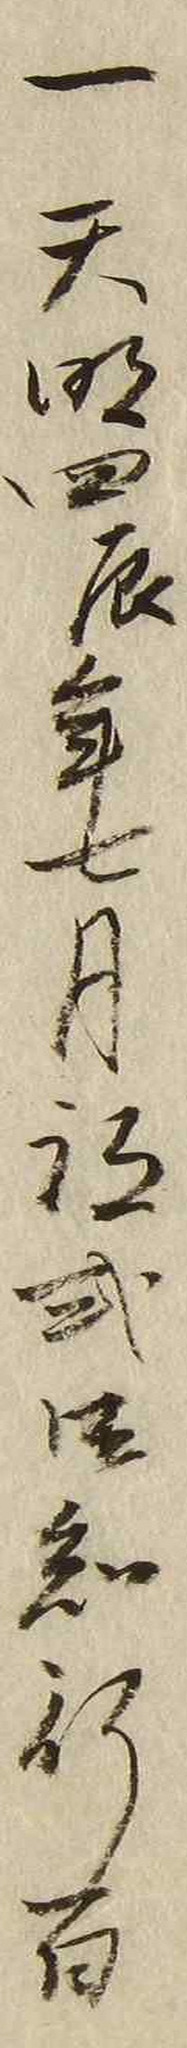一天明四辰年七月跡式御知行百

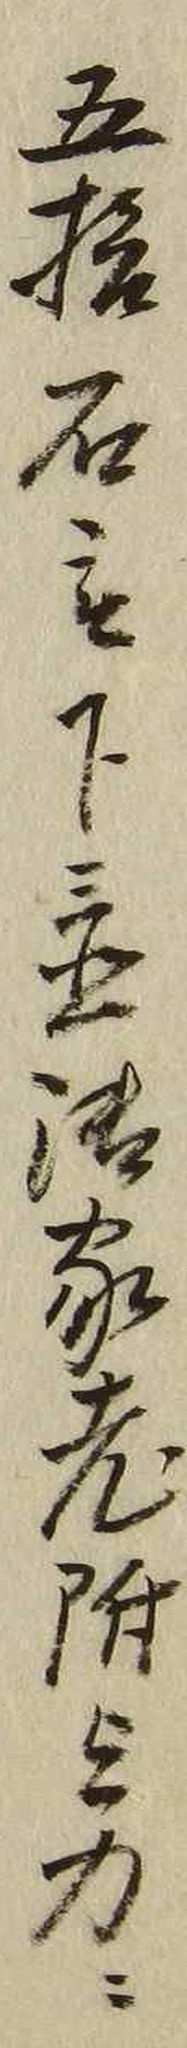五拾石被下置御家老附与力
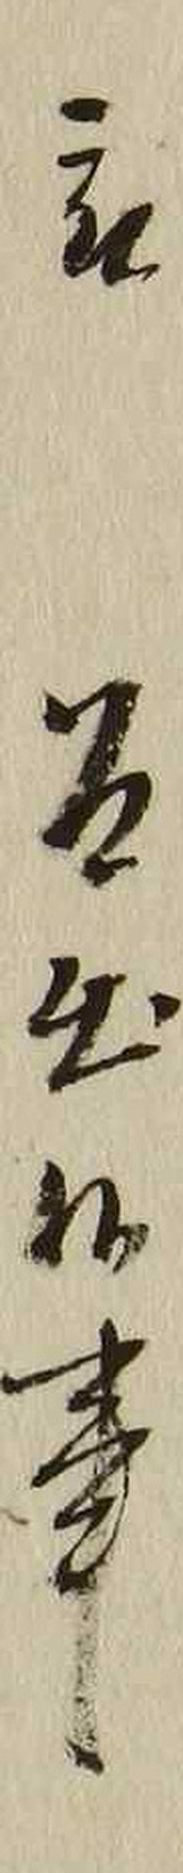被召出候事
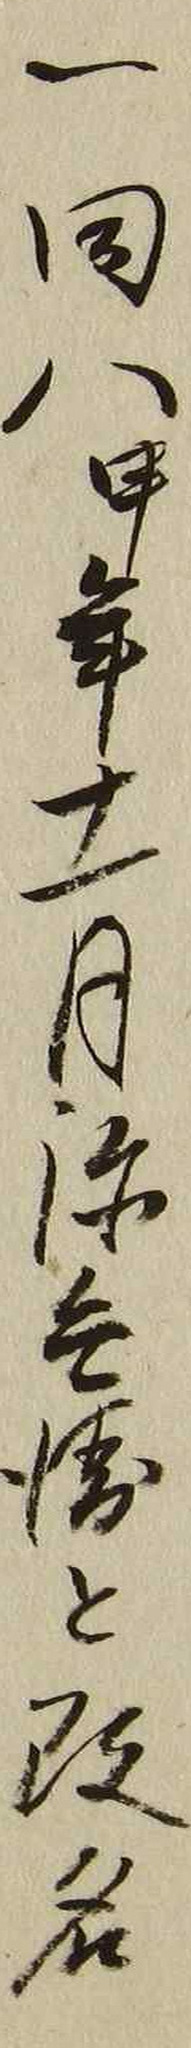一同八申年十一月弥兵衛と改名
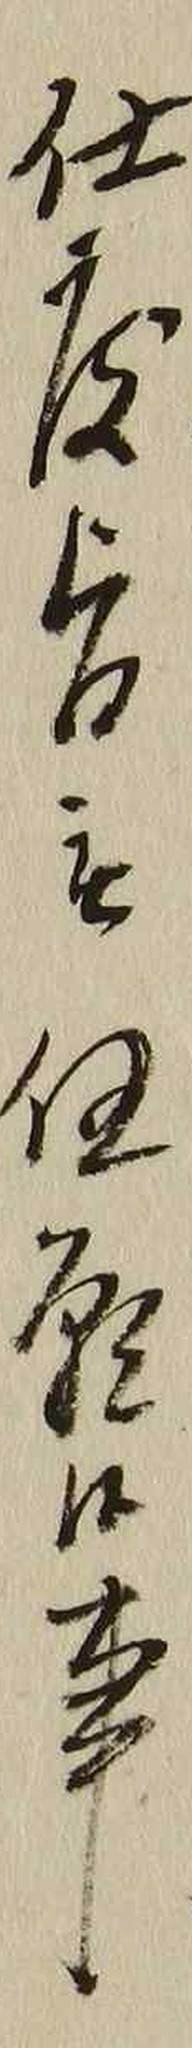仕度旨被任願候事
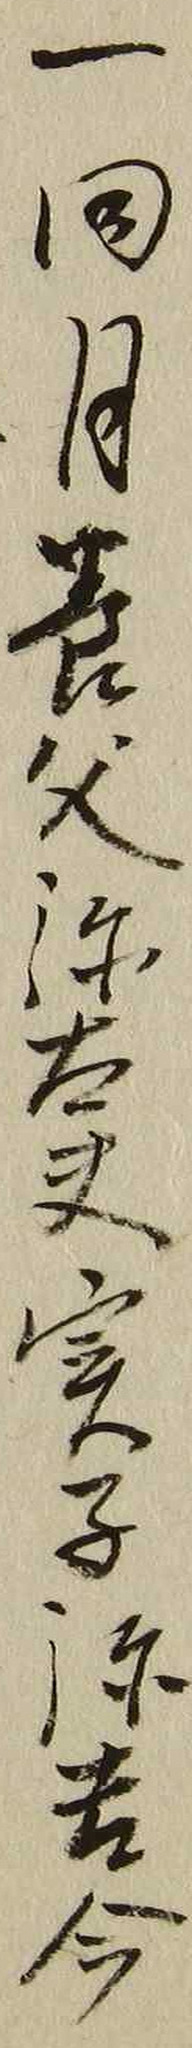一同月養父弥太夫実子弥吉今
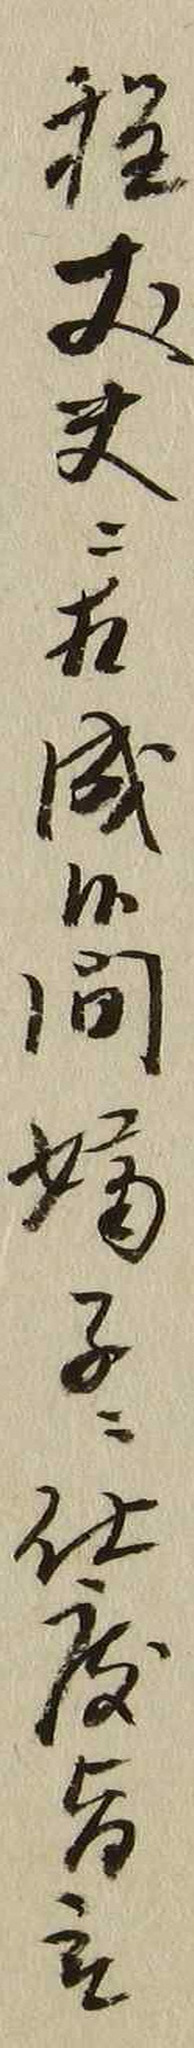程丈夫相成候間嫡子仕度旨被
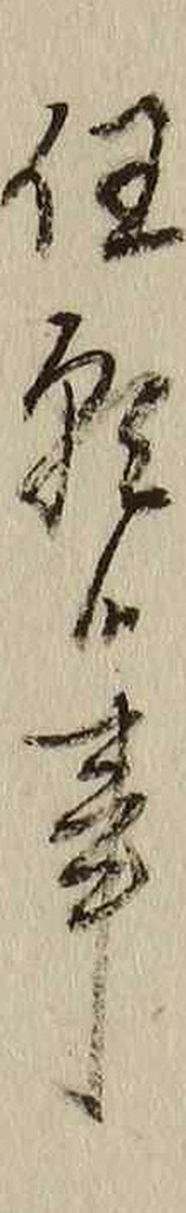任願候事
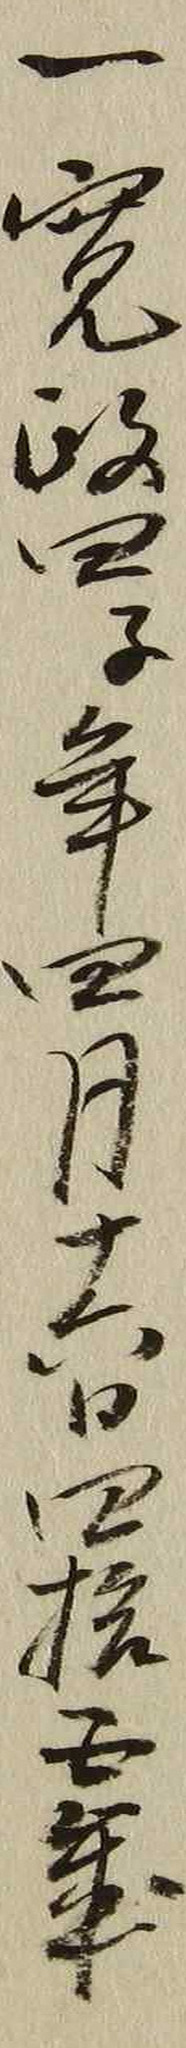一寛政四子年四月十六日四拾五歳
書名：諸士系譜　巻之350　せ之部1冊全
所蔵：会津若松市立会津図書館
